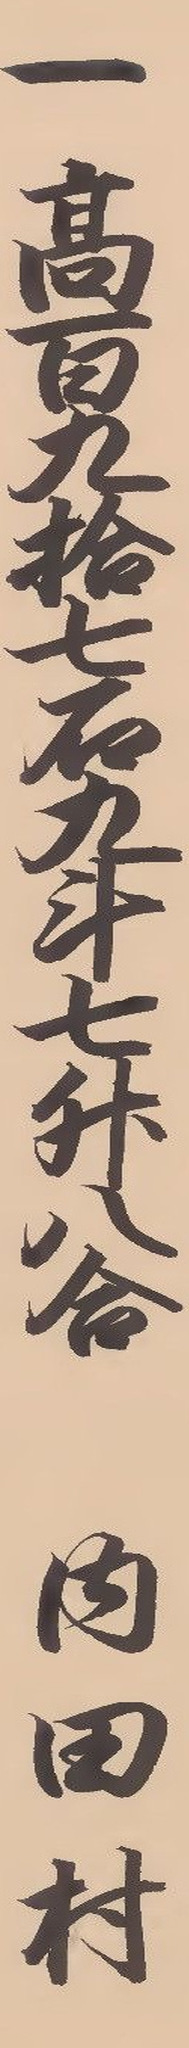一髙百九拾七石九斗七升八合内田村
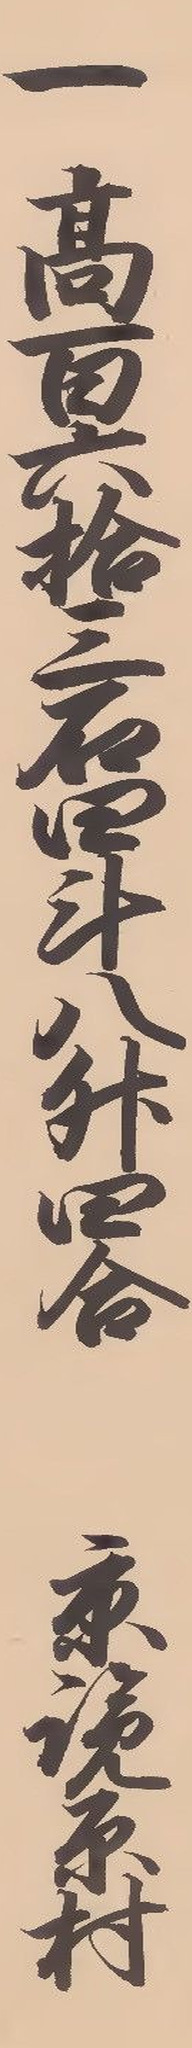一髙百六拾三石四斗八升四合京覧原村
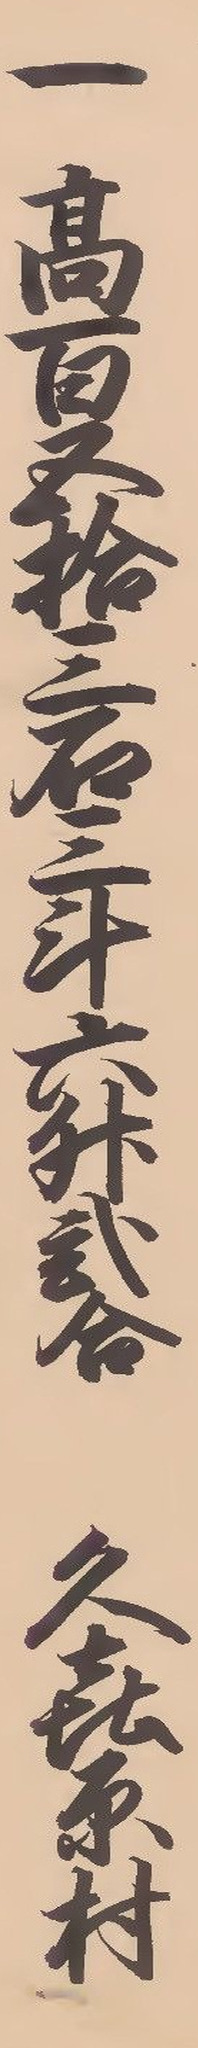一髙百五拾三石三斗六升弐合久喜原村

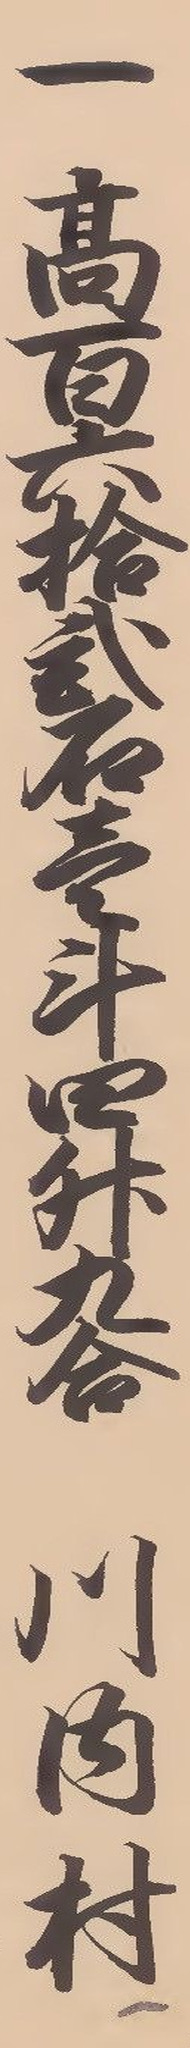一髙百六拾弐石壱斗四升九合川内村
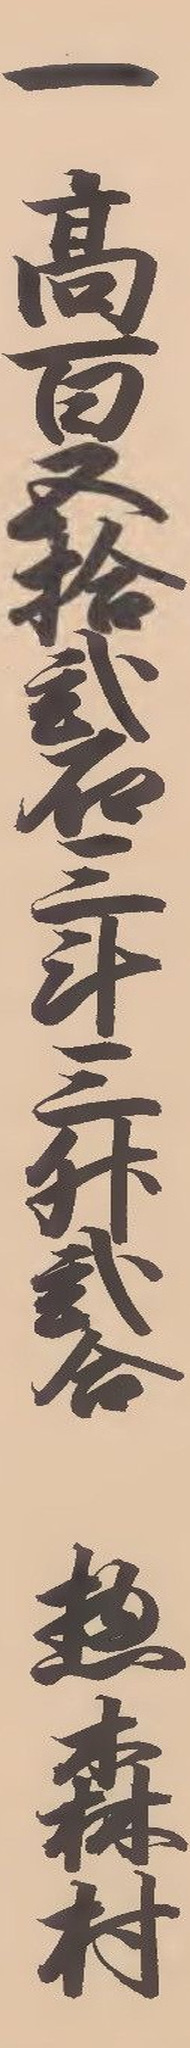一髙百五拾弐石三斗三升弐合惣森村
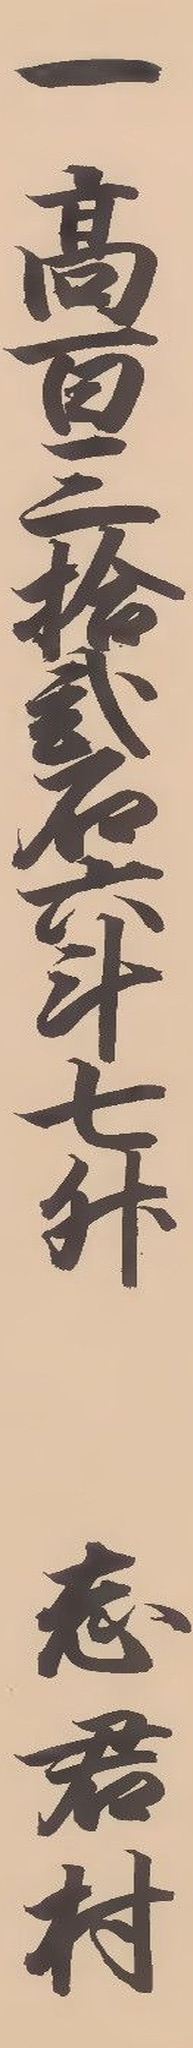一髙百三拾弐石六斗七升志君村
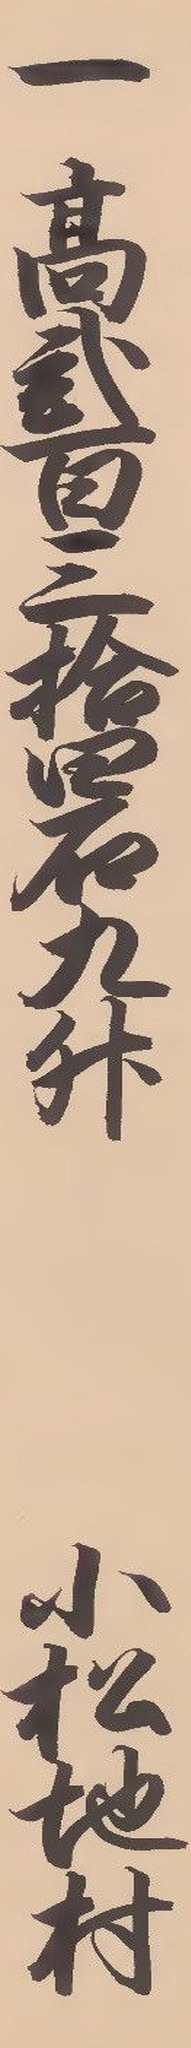一髙弐百三拾四石九升小松地村
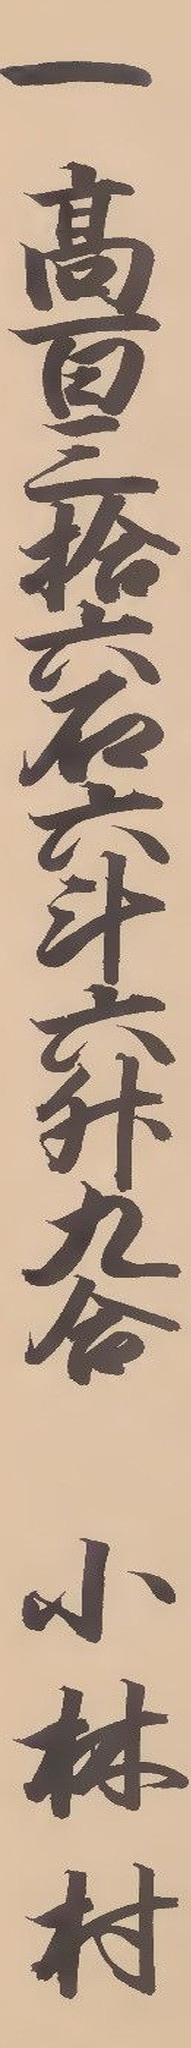一髙百三拾六石六斗六升九合小林村
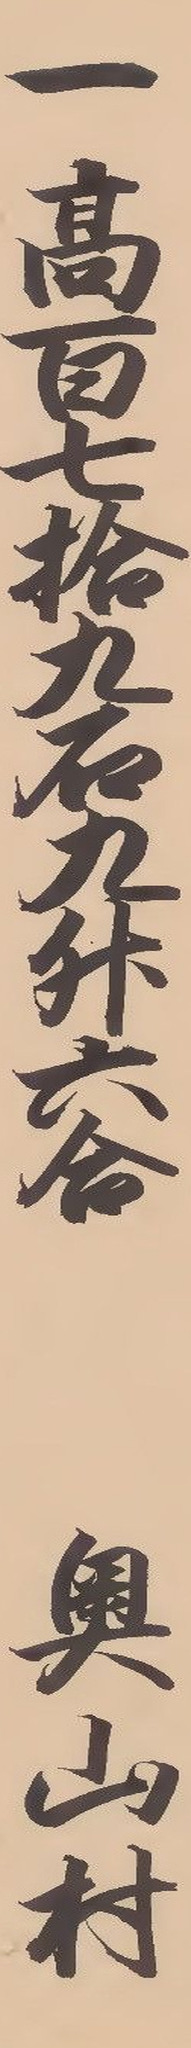一髙百七拾九石九升六合奥山村
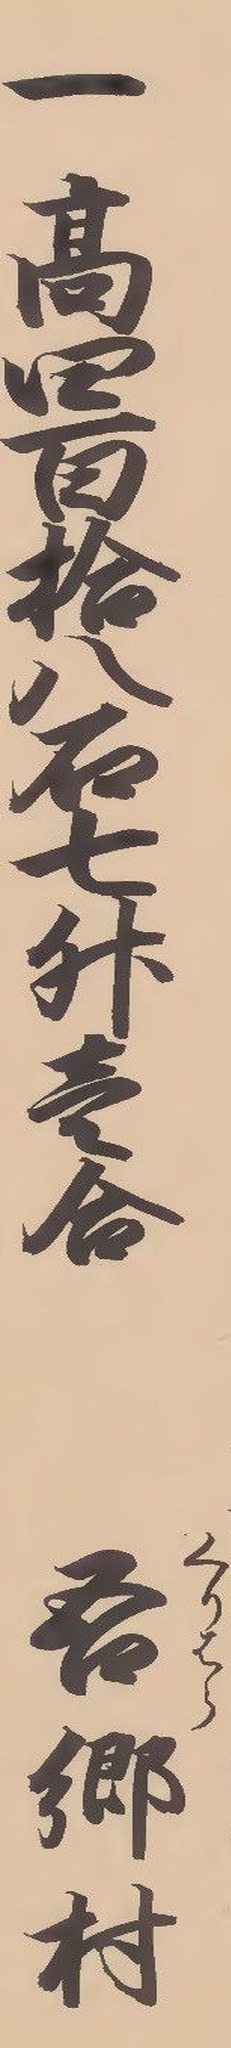一髙四百拾八石七升壱合吾郷村
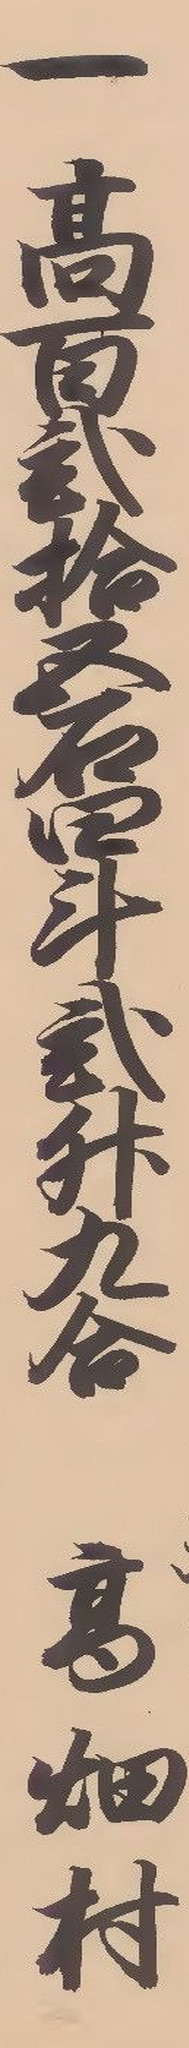一髙百弐拾五石四斗弐升九合髙畑村

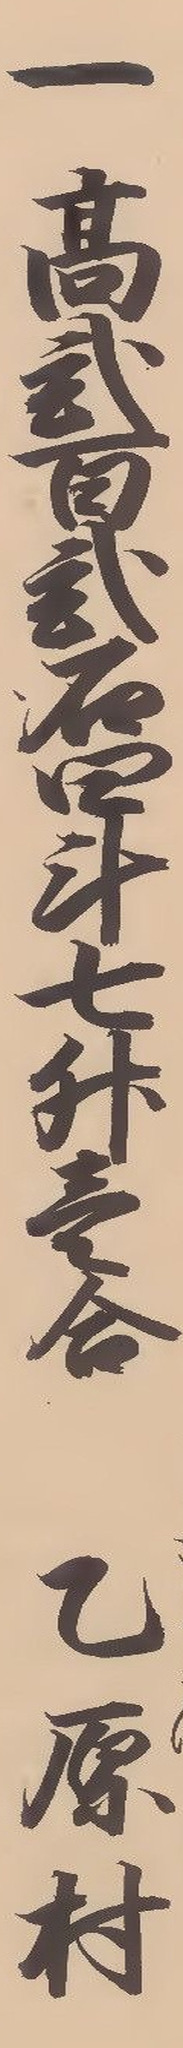一髙弐百弐石四斗七升壱合乙原村
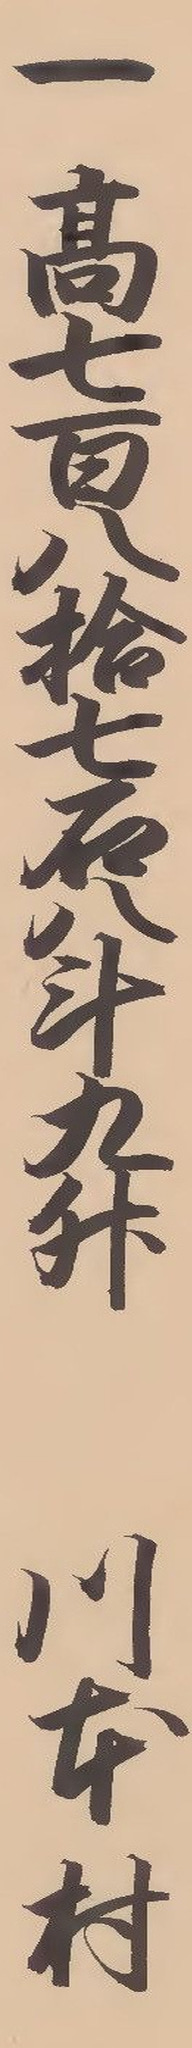一髙七百八拾七石八斗九升川本村
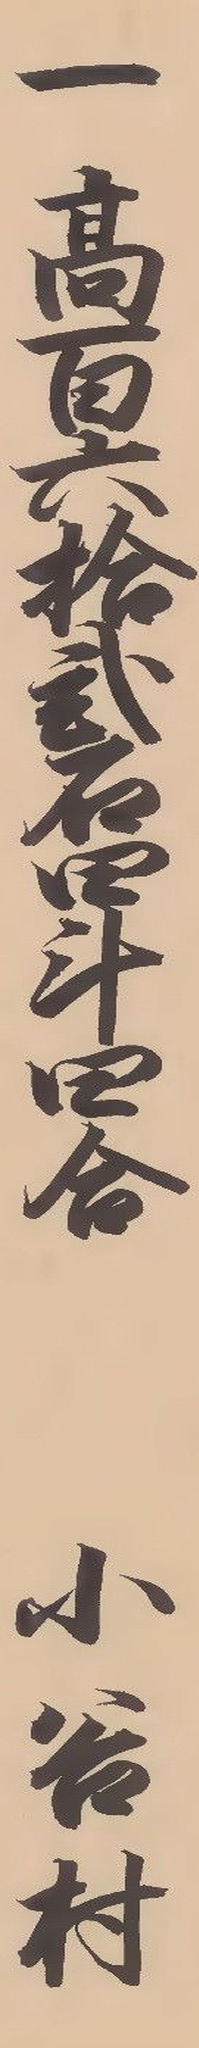一髙百六拾弐石四斗四合小谷村
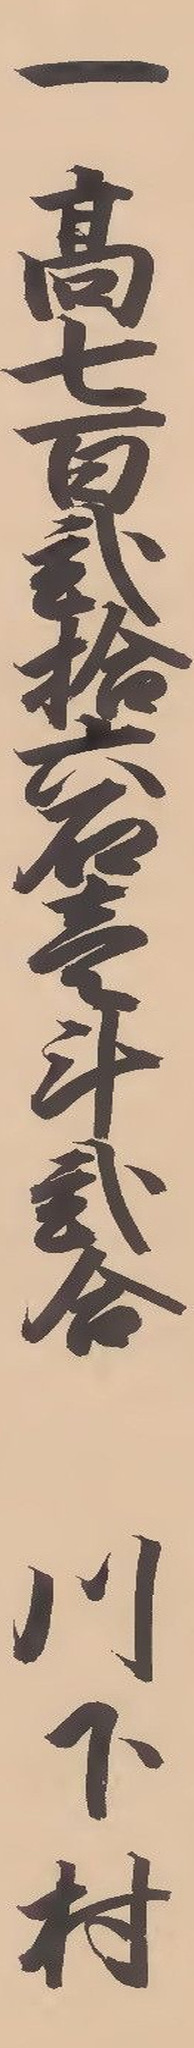一髙七百弐拾六石壱斗弐合川下村
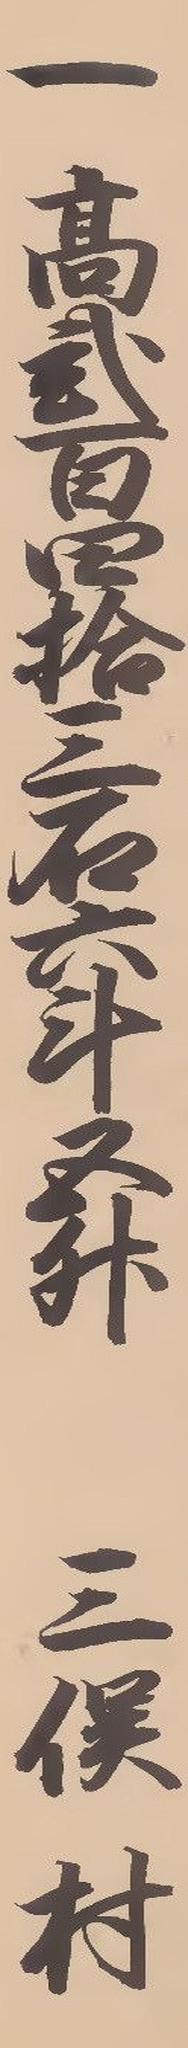一髙弐百四拾三石六斗五升三俣村
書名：石見国郷帳
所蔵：国立公文書館 National Archives of Japan
